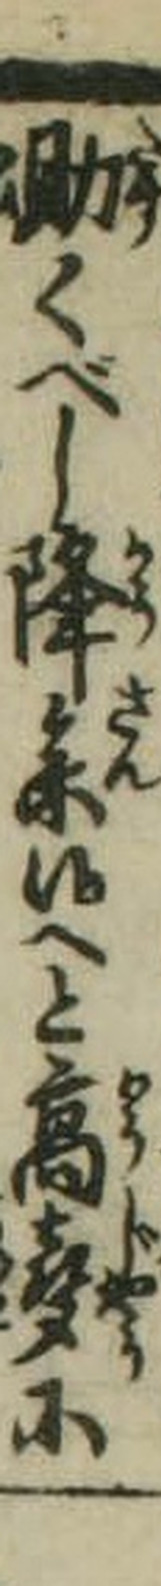助くべし降参候へと高声に
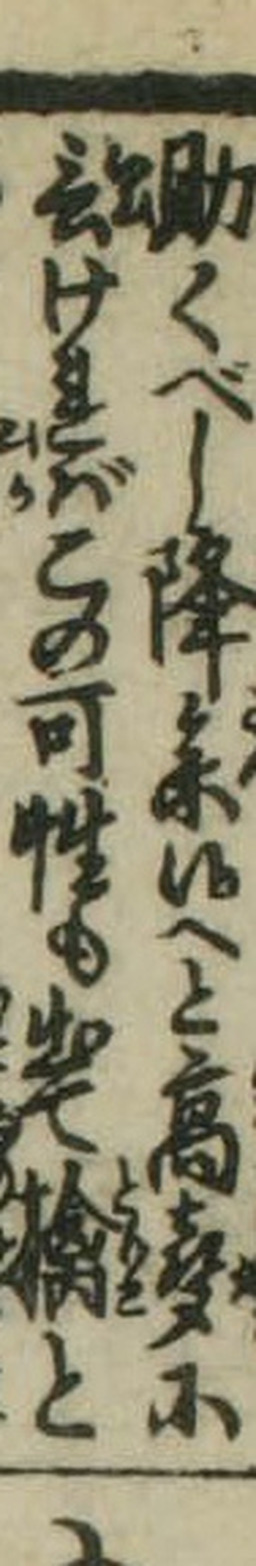言ければこの可性も出て擒と
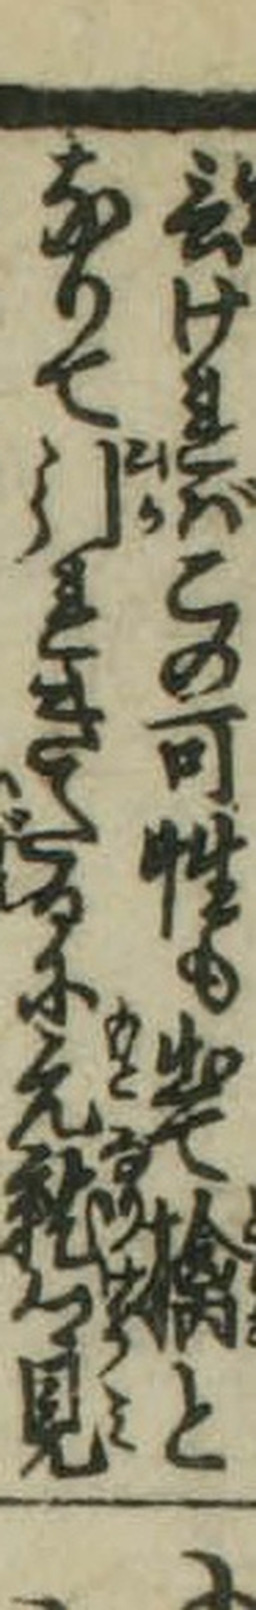なりて引れきたるに元就卿見
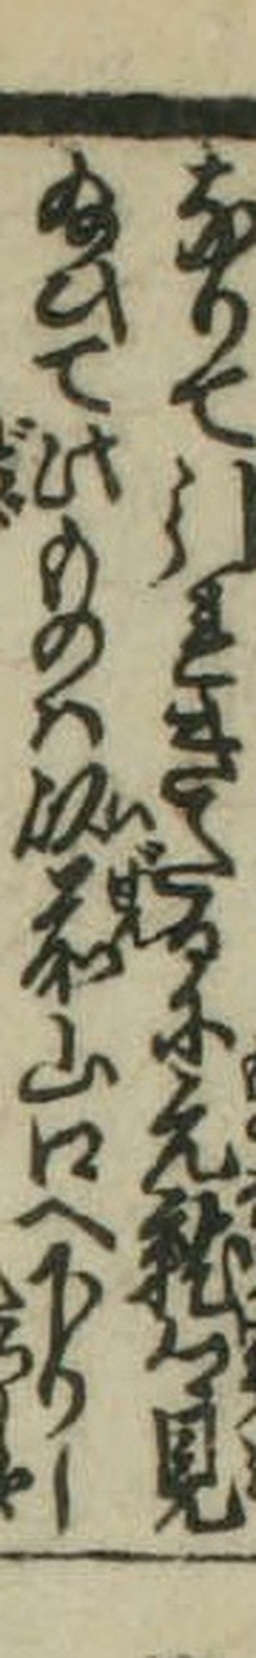たまひて此ものは以前山口へ下りし
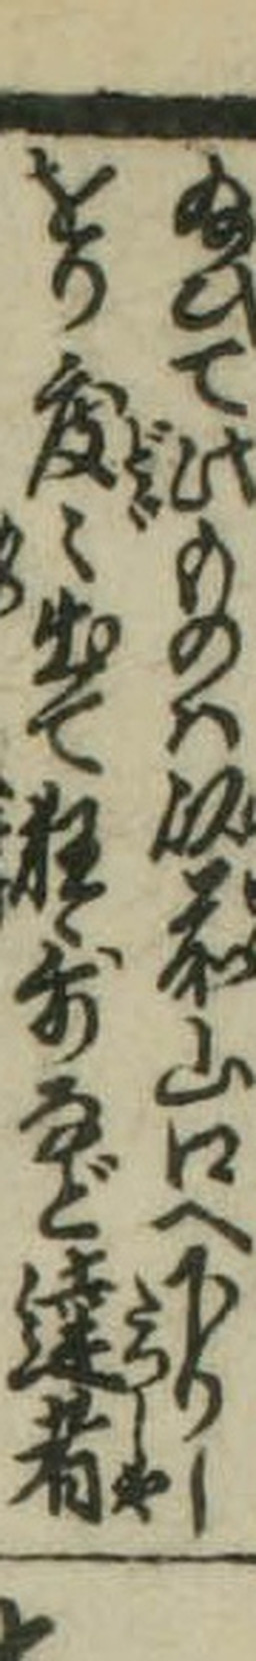をり度々出て狂歌など達者
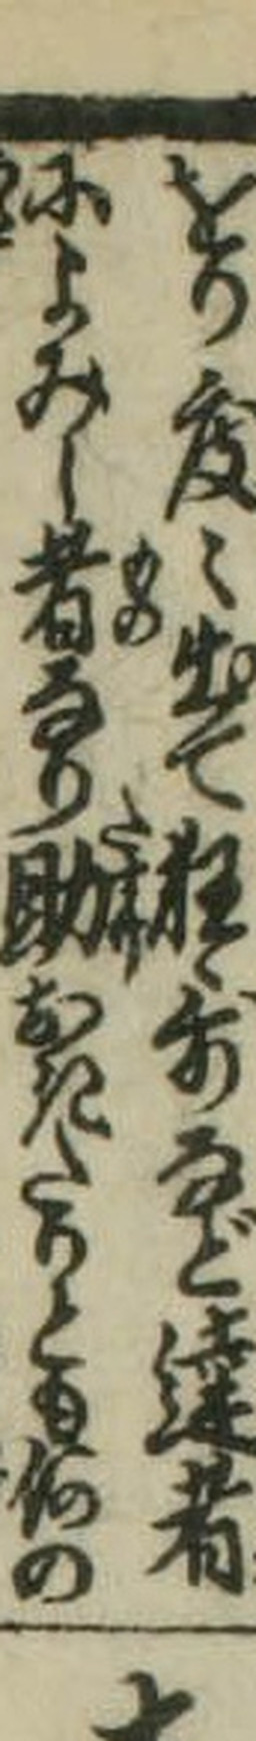によみし者なり助おきたりとも何の
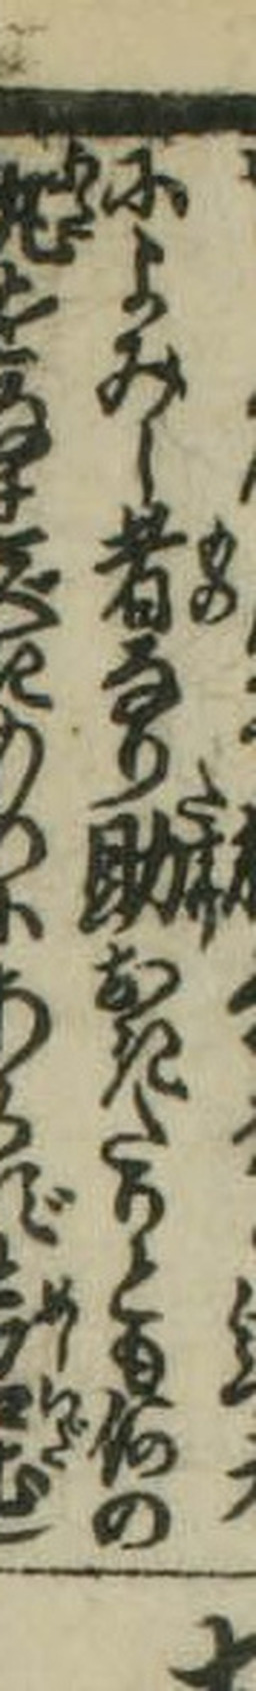仇をなすべきものにあらずと召出し
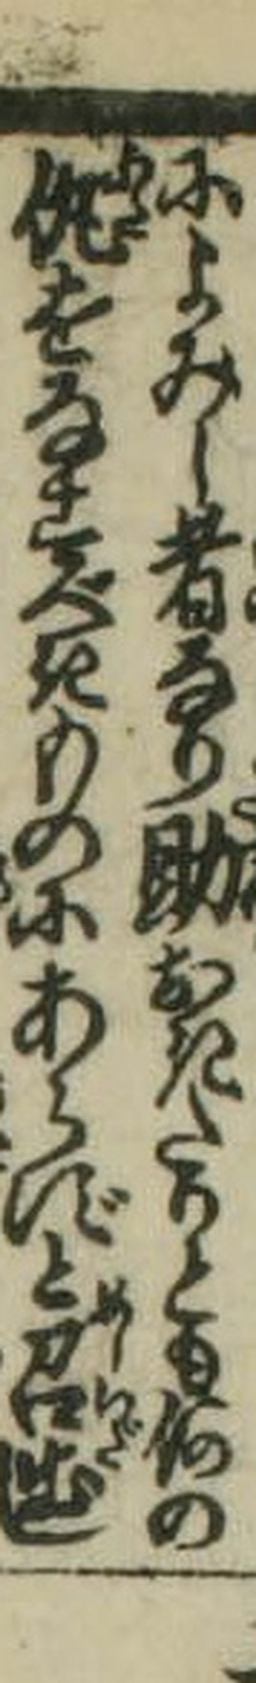仇をなすべきものにあらずと召出し
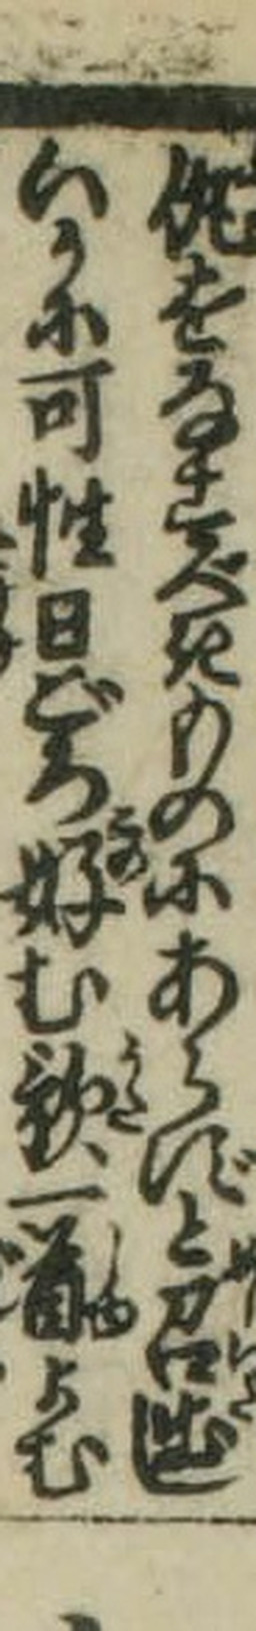いかに可性日ごろ好む歌一首よむ
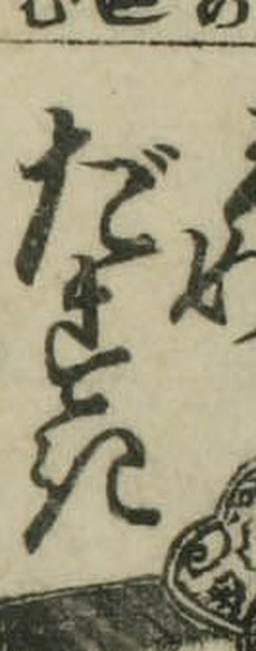だすき
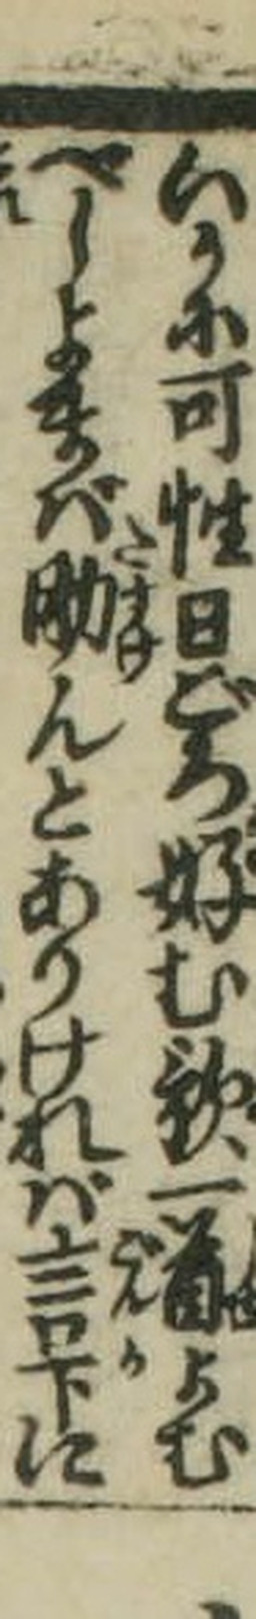べしよまば助んとありければ言下に
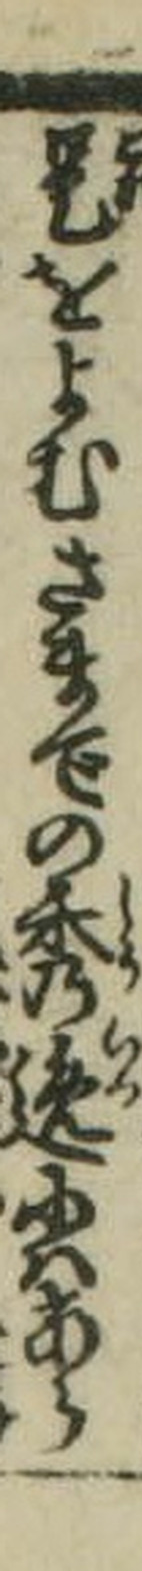是をよむさまでの秀逸にはあら
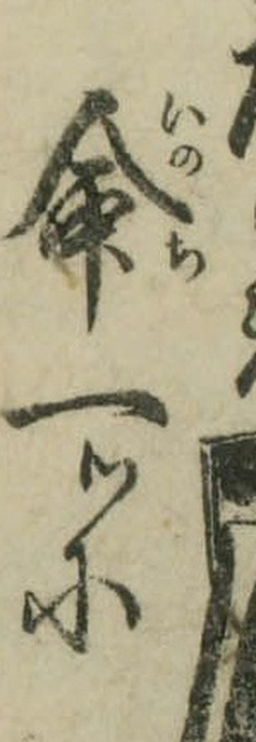命一つに
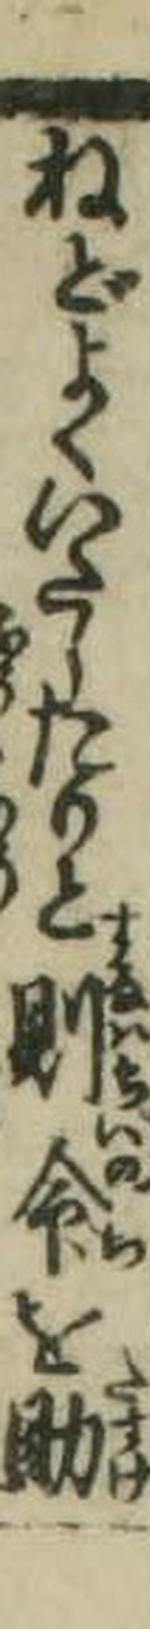ねどよくいたしたりと則命を助
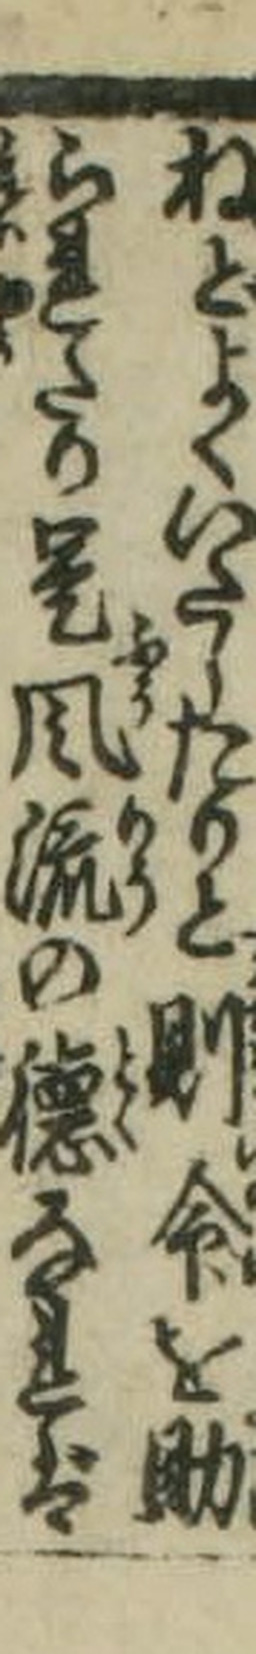られたり是風流の徳なれば
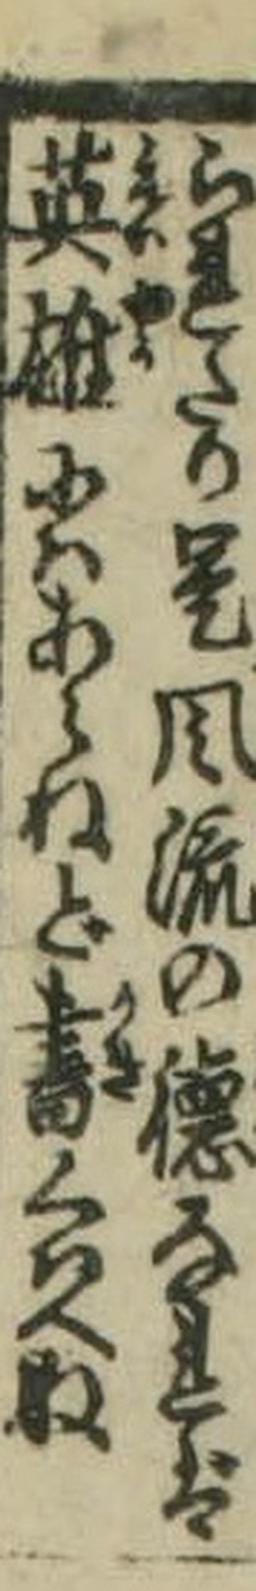英雄にはあらねど書くはへぬ
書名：續英雄百人一首
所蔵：東京学芸大学附属図書館
